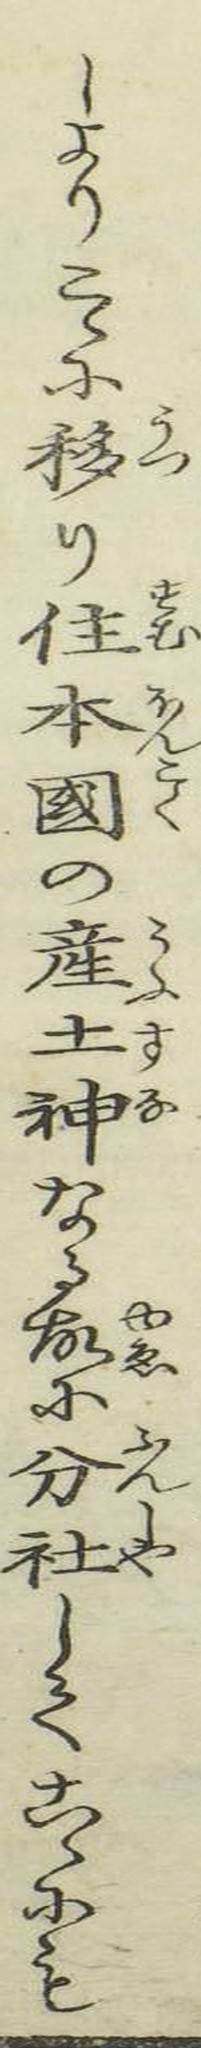しよりこゝに移り住本國の産土神なる故に分社してこゝにも

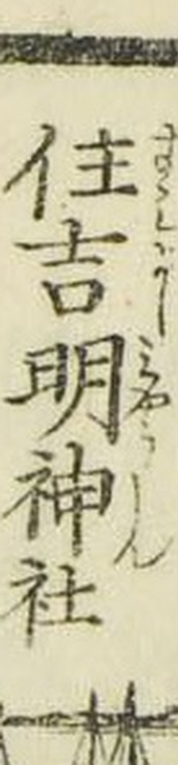住吉明神社
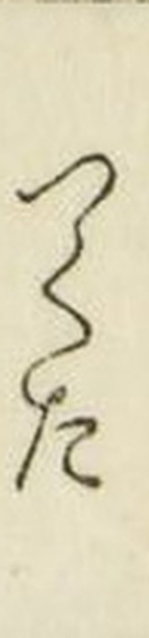つくた

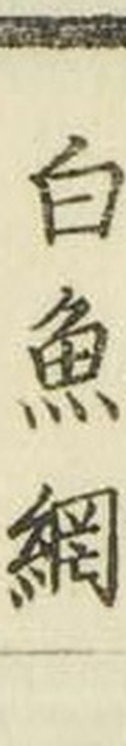白魚網
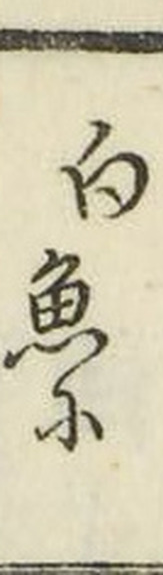白魚に
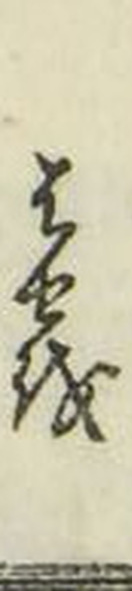はせを

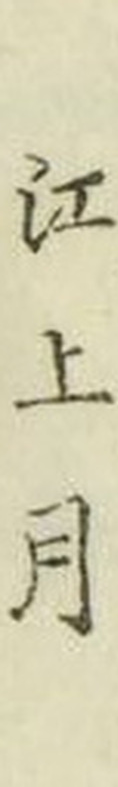江上月
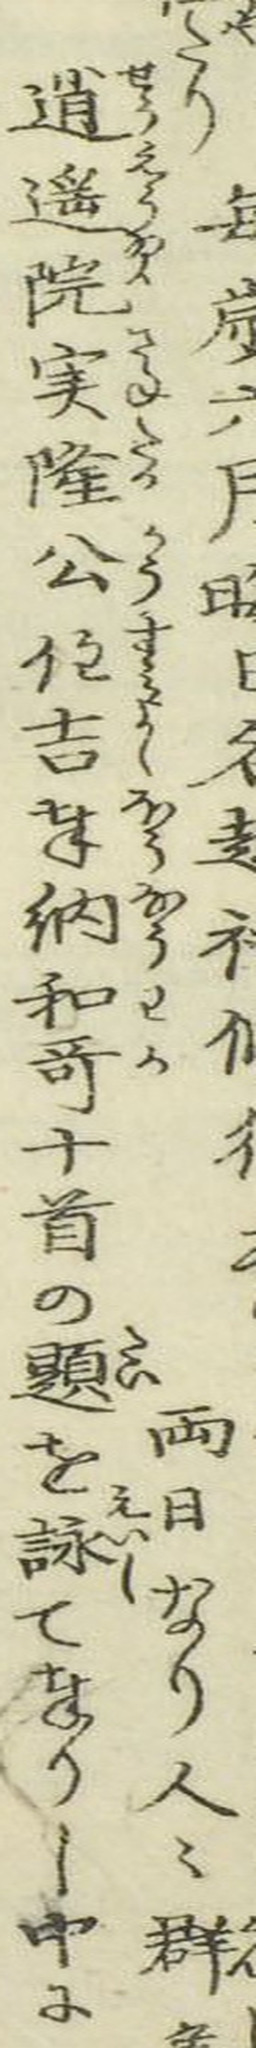逍遥院実隆公住吉奉納和哥十首の題を詠て奉りし中に
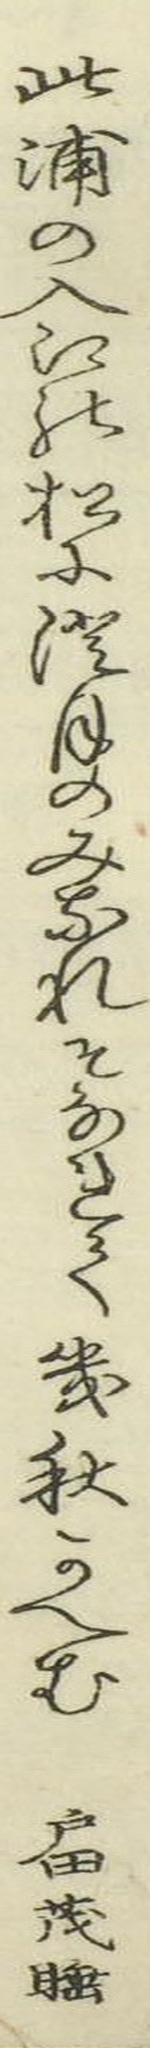此浦の入江の松に澄月のみなれそなれて幾秋かへむ戸田茂睡
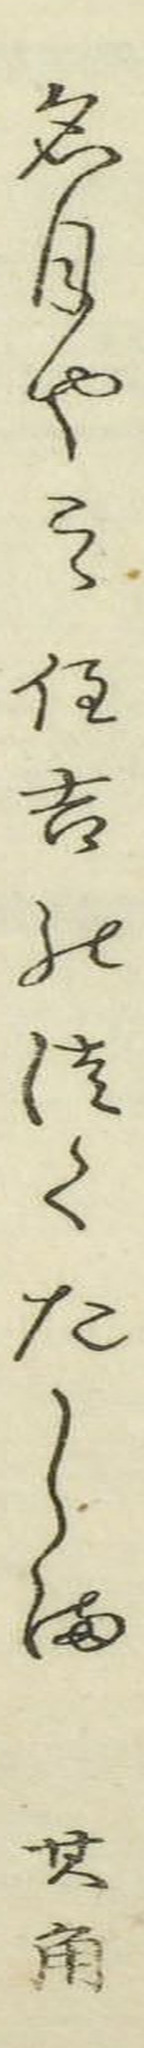名月やこゝ住吉のつくたしま其角
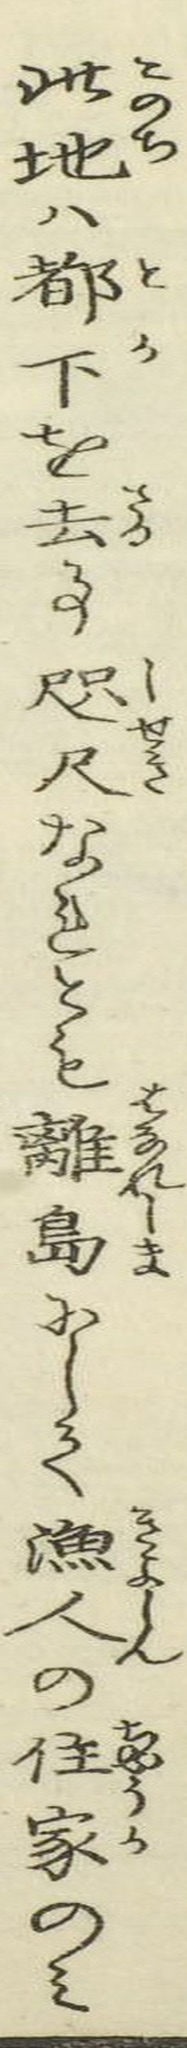此地は都下を去事咫尺なれとも離島にして漁人の住家のみ
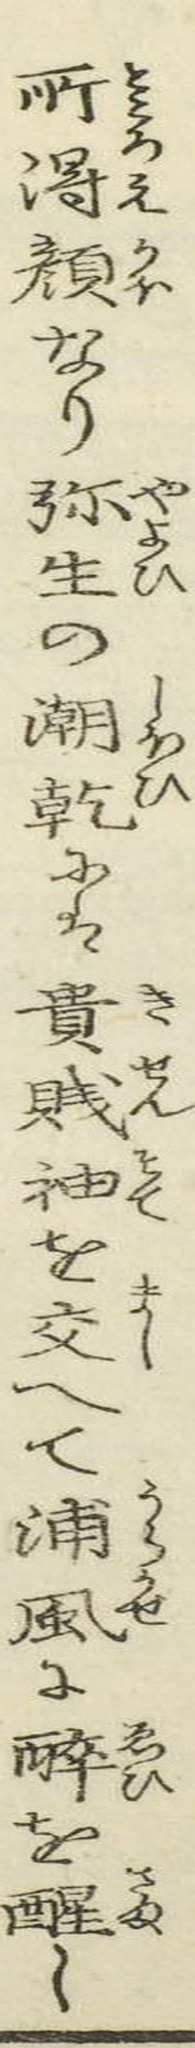所得顔なり弥生の潮乾には貴賤袖を交へて浦風に酔を醒し
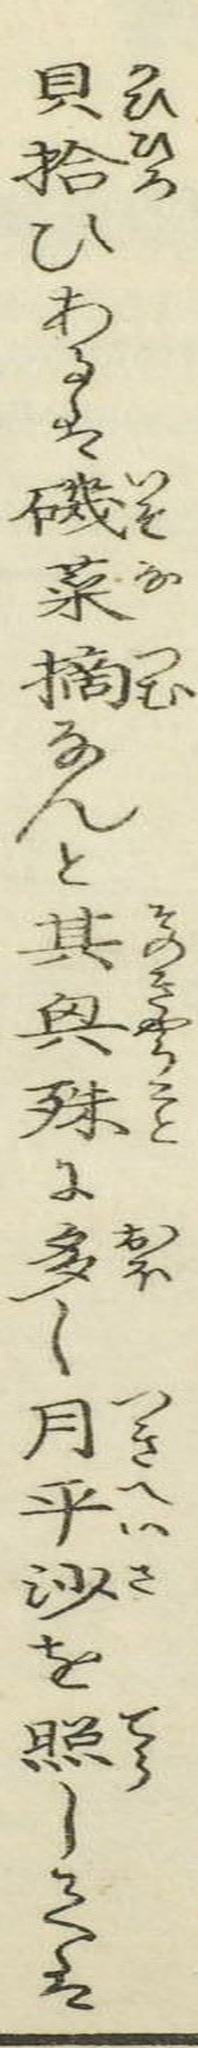貝拾ひあるは磯菜摘なんと其興殊に多し月平沙を照しては
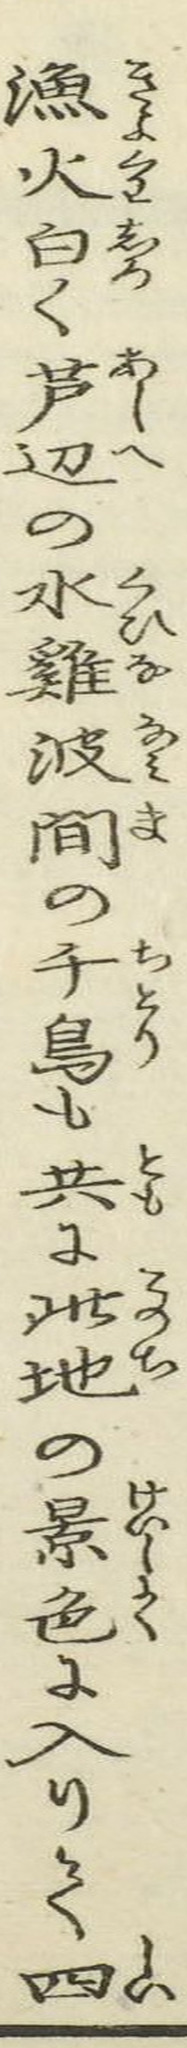漁火白く芦辺の水鶏波間の千鳥も共に此地の景色に入て四
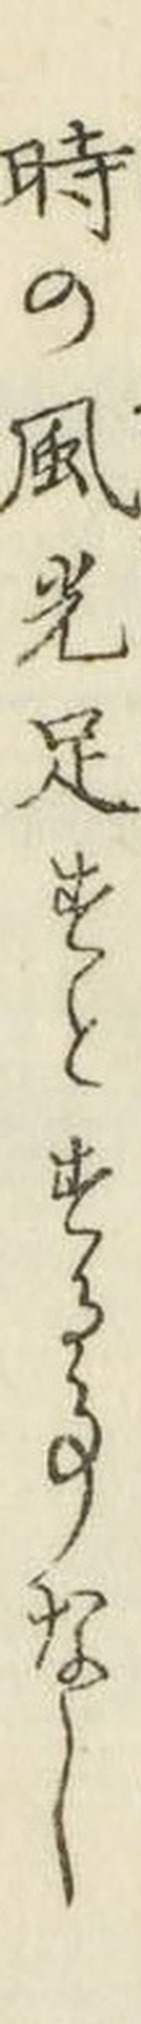時の風光足すとする事なし
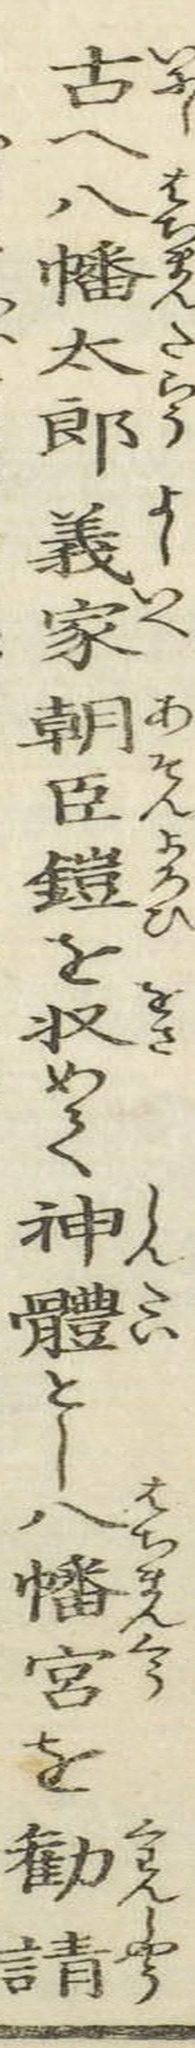古へ八幡太郎義家朝臣鎧を収めて神體とし八幡宮を勧請
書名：江戸名所図会 20巻 巻之2
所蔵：東京学芸大学教育コンテンツアーカイブ
